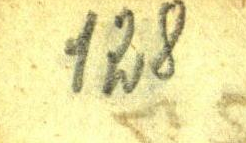128
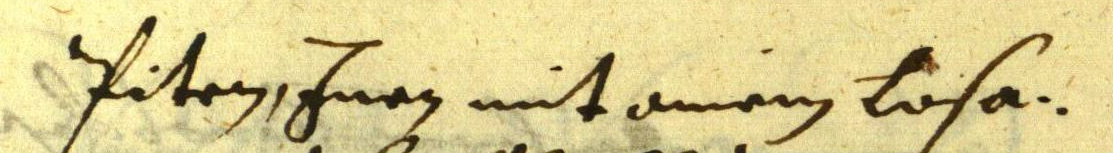Piten, Inen mit ainem Losa¬
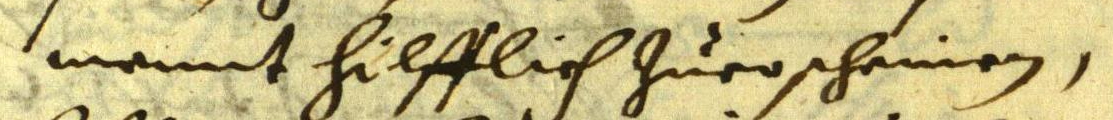mennt hilfflich Zūerscheinen,
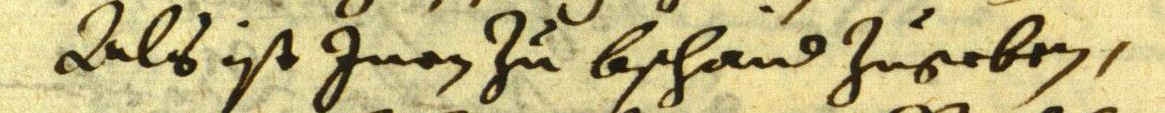Als ist Inen Zū bschaid Zūgeben,
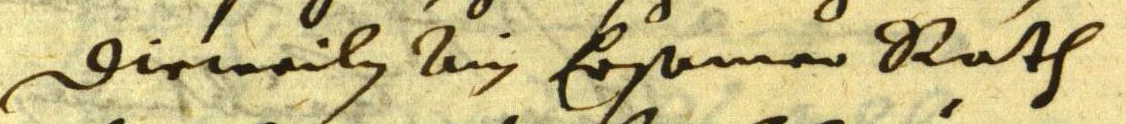dieweiln Ain Ersamer Rath
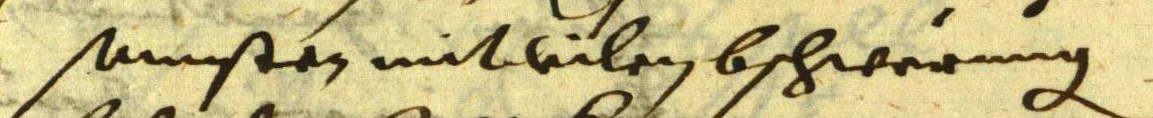sonsten mit vilen bschwerūng
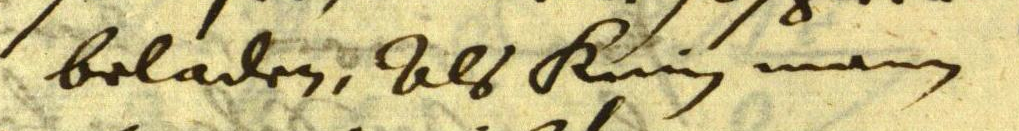beladen, Als Kinn mann
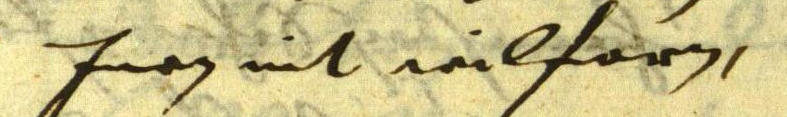Inen nit wilfarn,
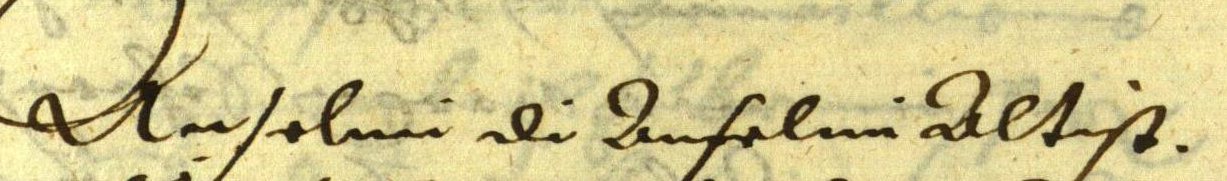Anselmi di Anselmi Altist.
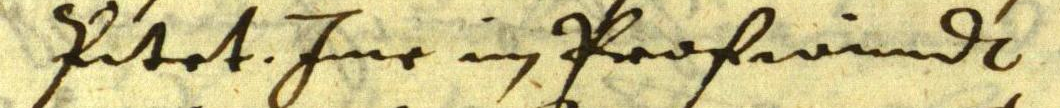Pitet. Ime im Profianndt
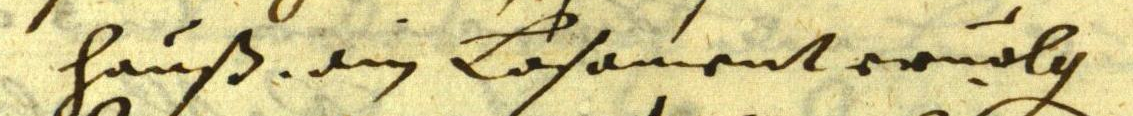haūß. ain Losament ervolg
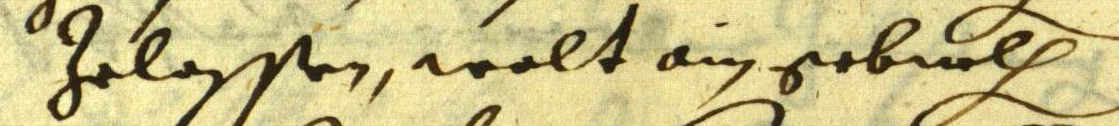Zelassen, wolt ain gebirl
